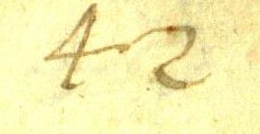42
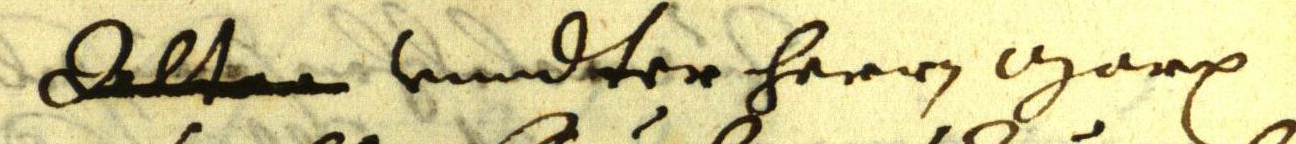Altar vndter herrn Marx
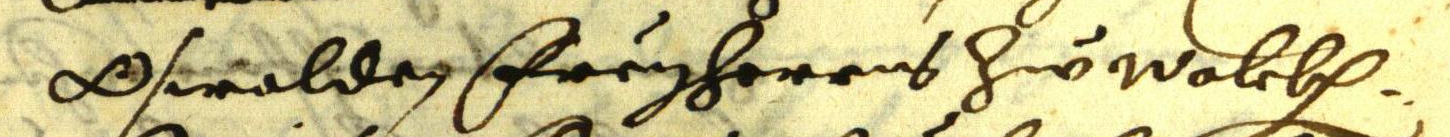Oswalden Freȳherrns Zū Wolckh¬
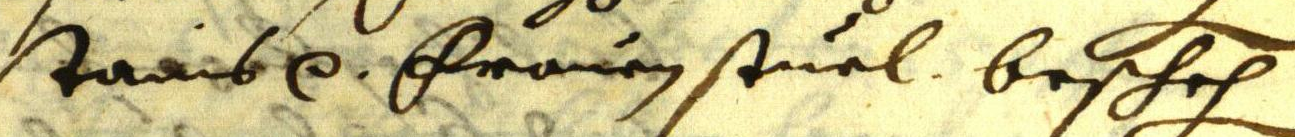stains etc. Fraūen stūel bescheh.
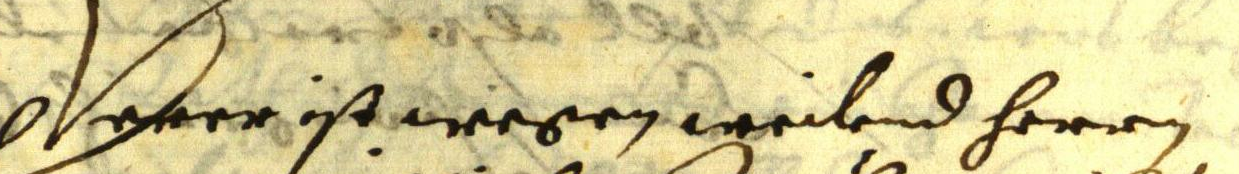Verer ist wegen weilend herrn
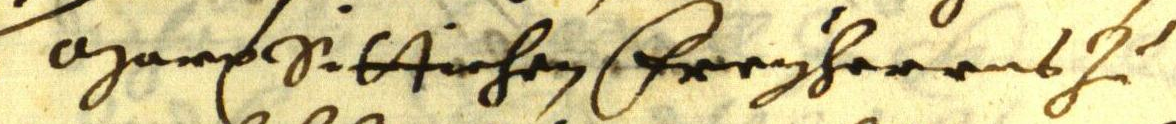Marx Sittichen Freȳherrns Zū
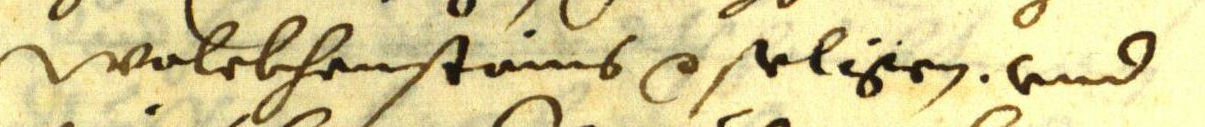Wolckhenstains etc. seligen. vnd
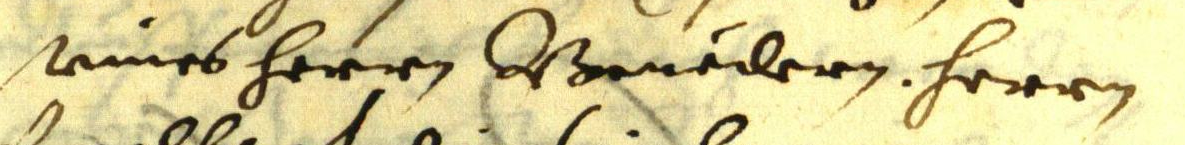seines herrn Brūedern. herrn
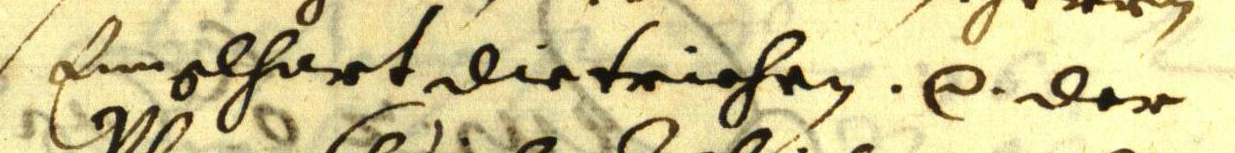Ennglhart Dietrichen. etc. der
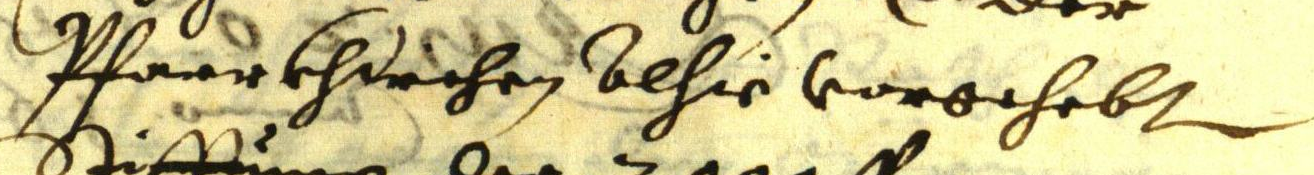Pfarrkhirchen Alhie vorgehebt
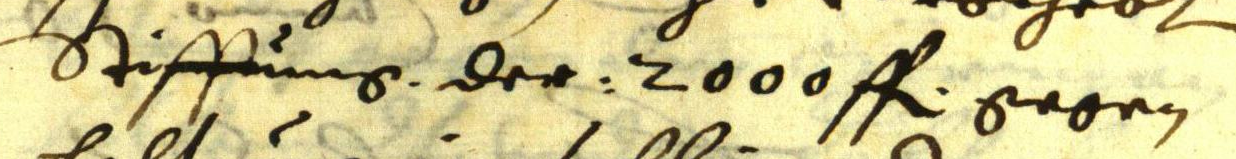Stifftūng. der: 2000 fl. gegen
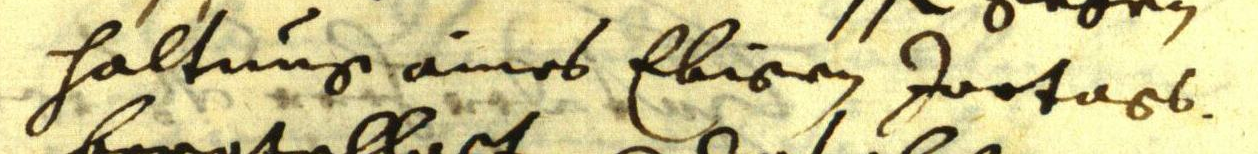Haltūng aines Ewigen Jartags.
